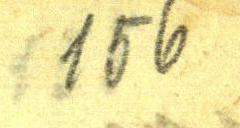156
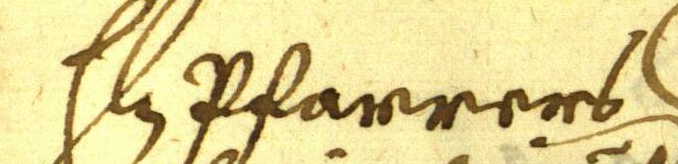Hln Pfarrers
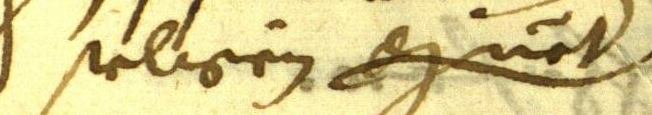seligen Mūet
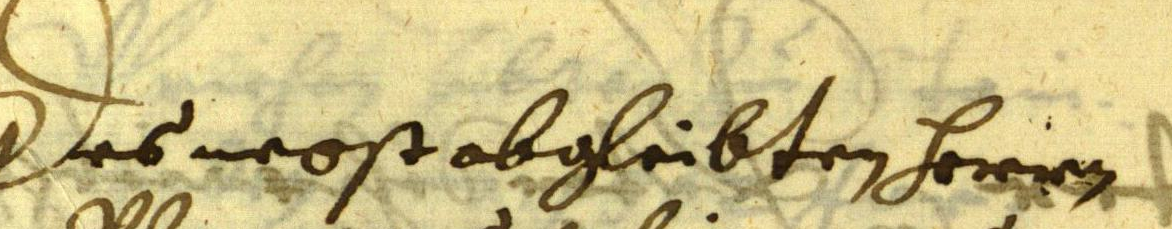Des negst abgleibten herrn
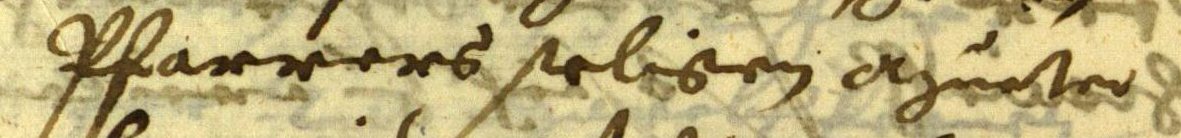Pfarrers seligen Mūeter
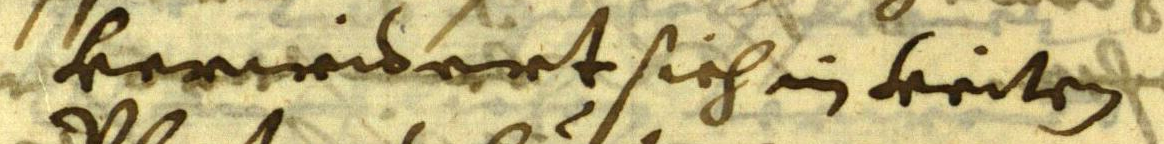verwidert sich in veiten
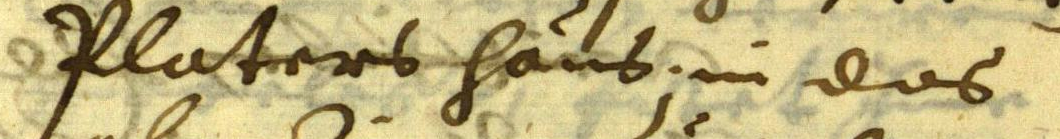Platers haūs. in das
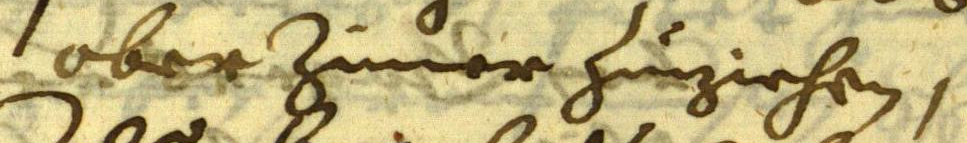ober Zimer Zūziehen,
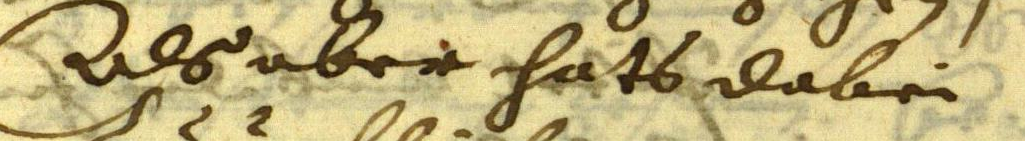Als aber hats dabei
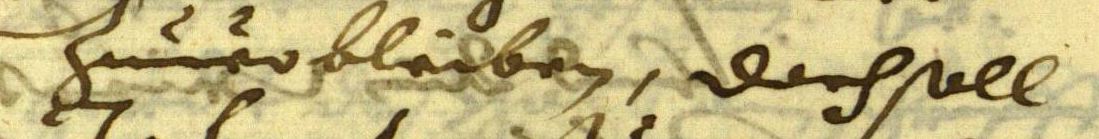Zūūerbleiben, doch soll
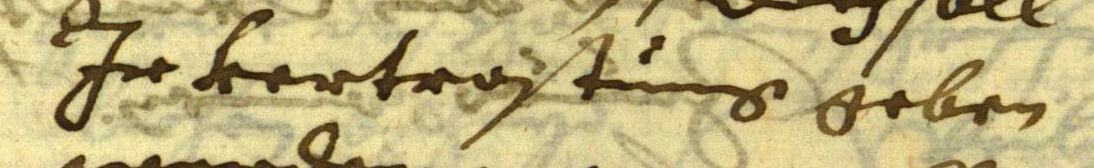Ir vertrostūng geben
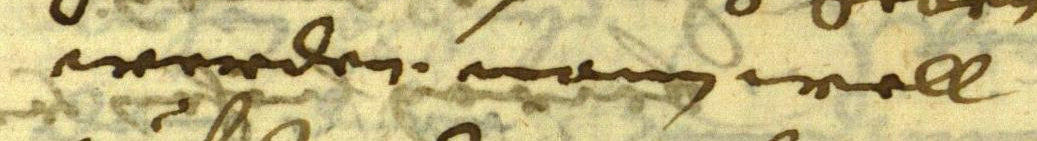werden. mann well
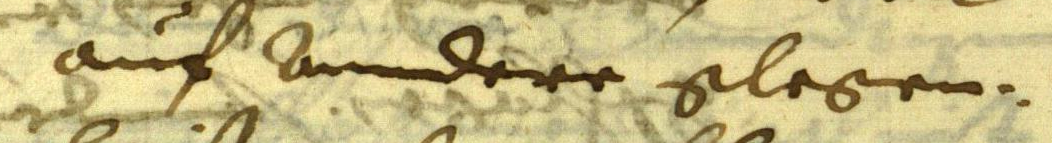aūf Anndere glegen¬
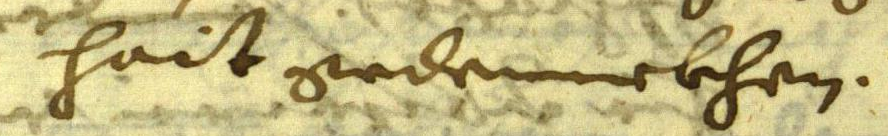hait gedennckhen.
